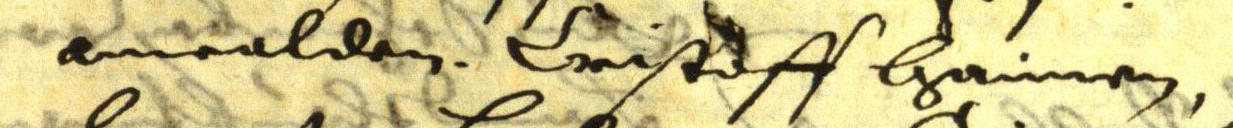anwalden. Cristoff Haimen,
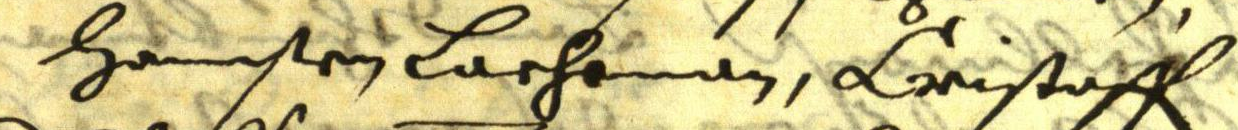Hannsen Locheman, Cristoff
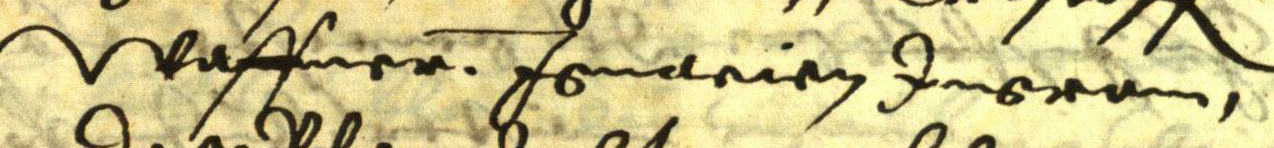Waffner. Ignacien Ingram,
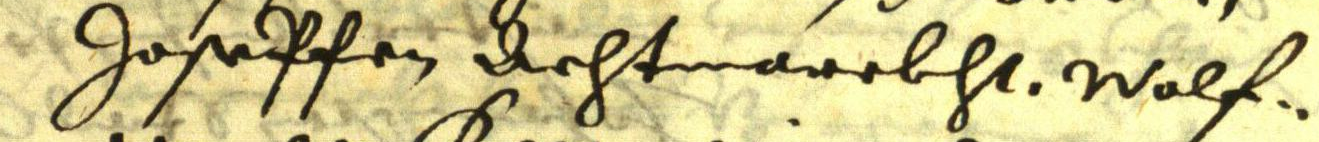JosePfen Achtmarckht. Wolf¬
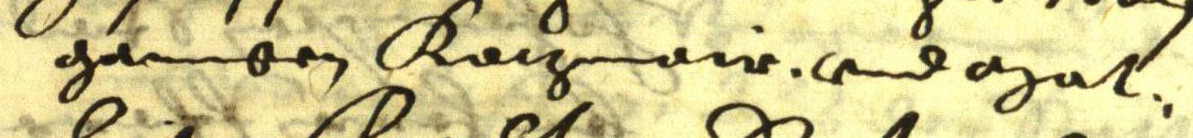ganngen Kazmair. vnd Mat¬
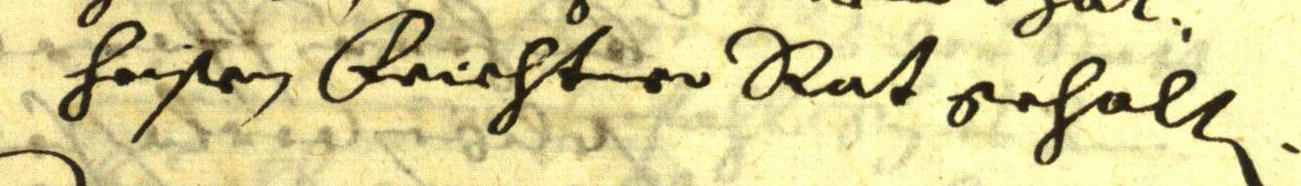heisen Feichtner Rat gehalt.
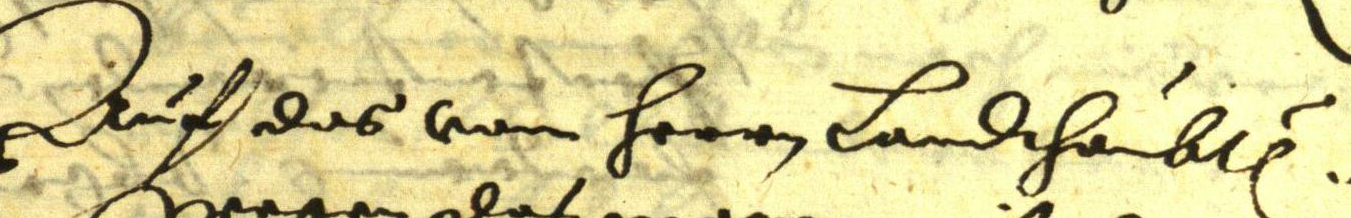Aūf das vom herrn Landthaūbt:
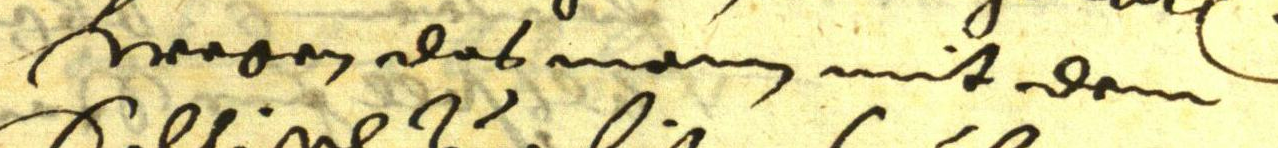wegen das mann mit dem
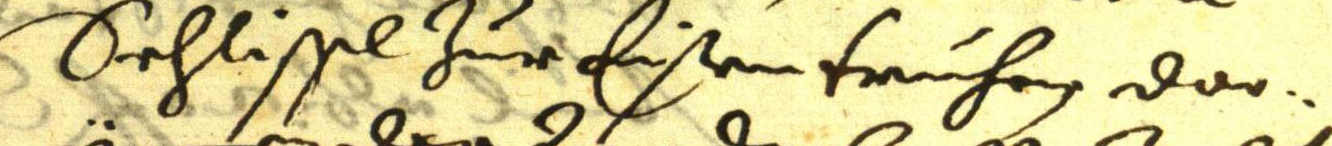Schlissl Zūr Eisen trūhen dar¬
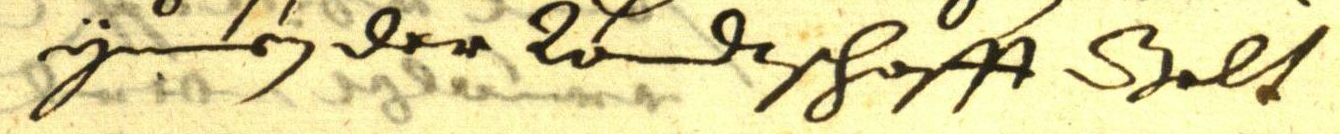ÿnnen der Lanndtschafft Gelt
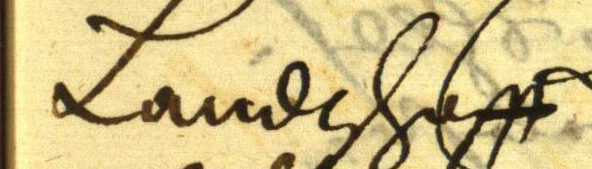Landschafft
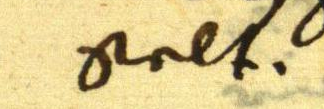gelt.
